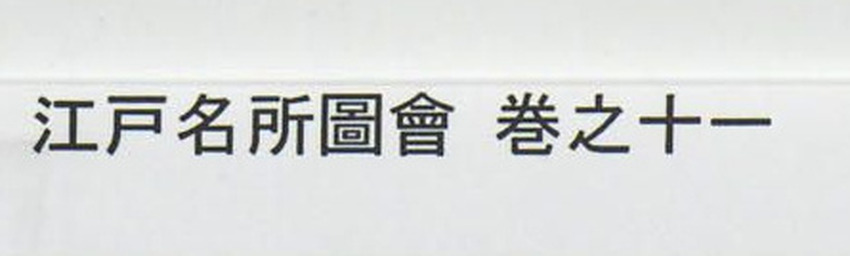江戸名所図会十一

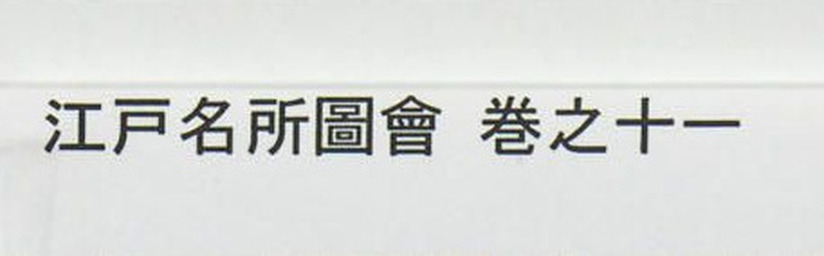江戸名所図会巻之四
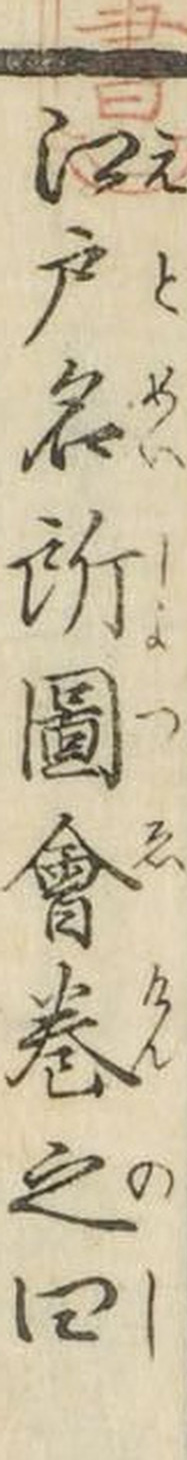江戸名所図会巻之四
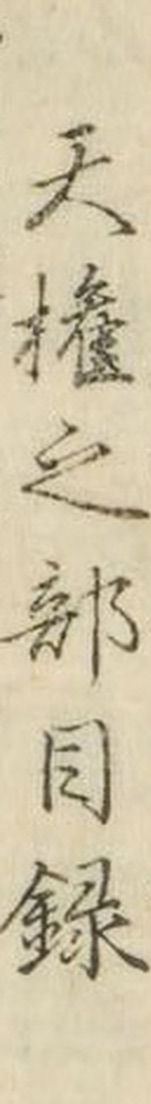天権之部目録

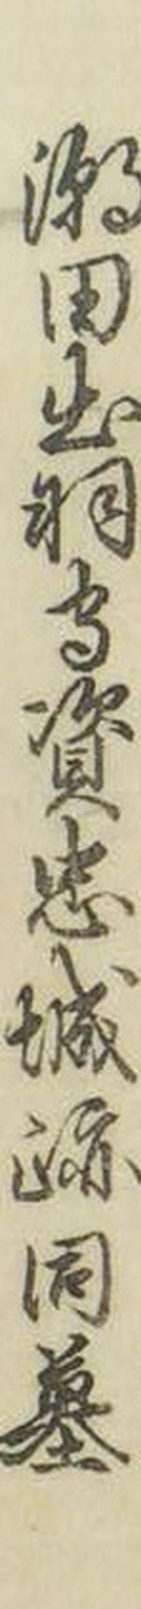黒塚潮田出羽守資忠城址同墓

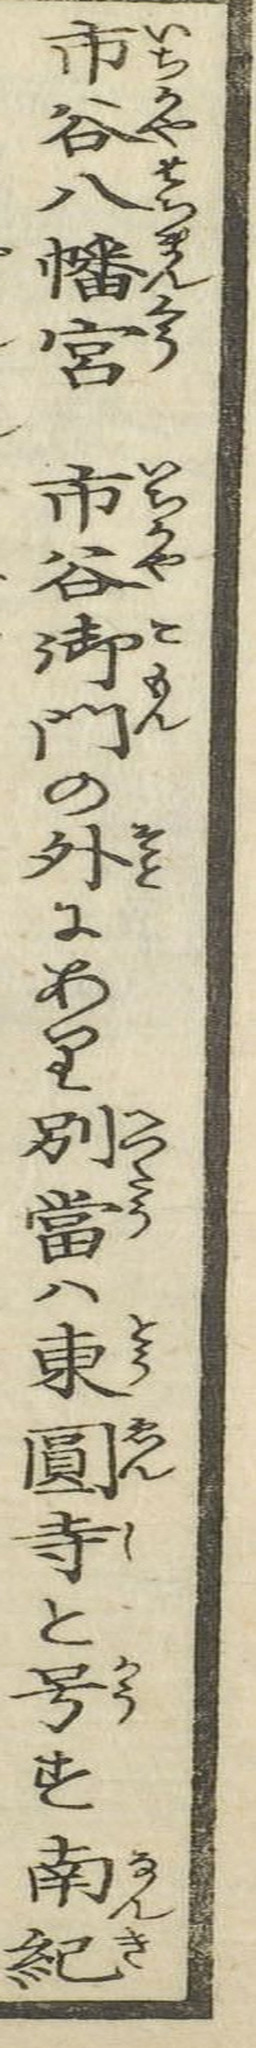市谷八幡宮市谷御門の外にあり別当は東円寺と号す南紀
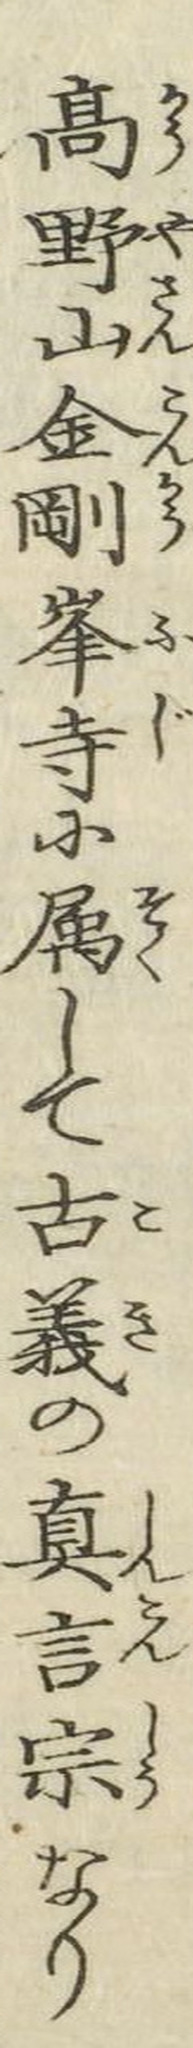高野山金剛峯寺に属して古義の真言宗なり
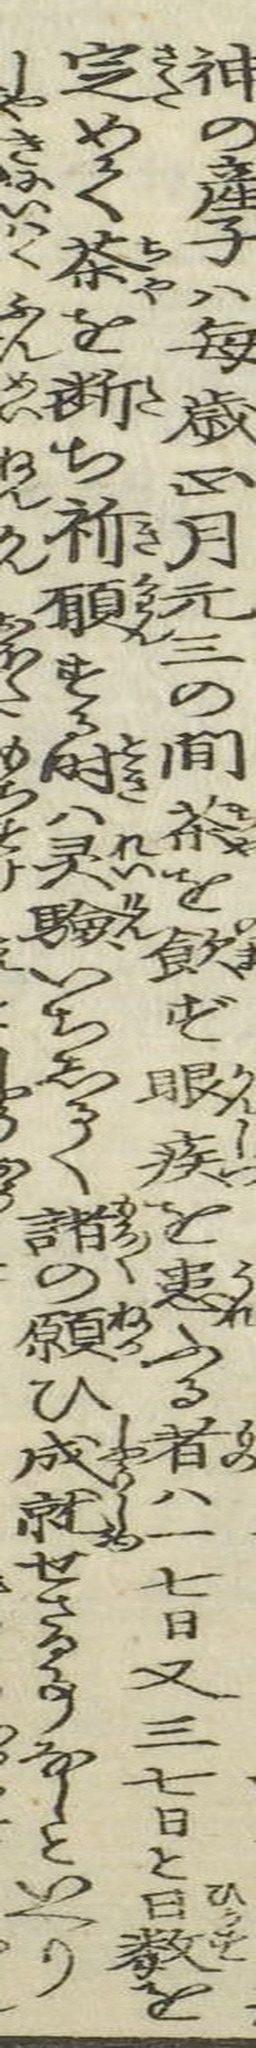定めて茶を断ち祈願する時は霊験いちしるく諸の願ひ成就せさる事なしといへり
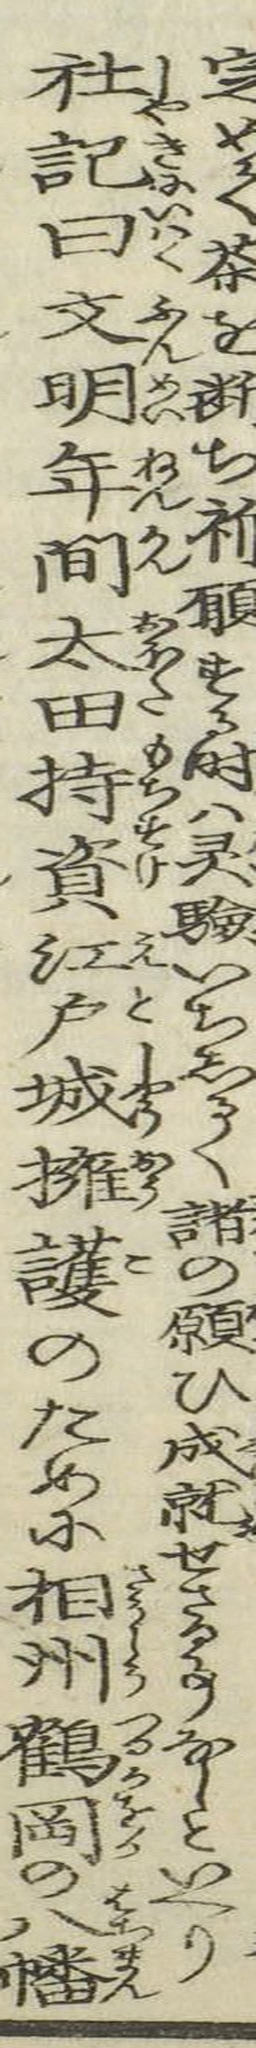社記曰文明年間太田持資江戸城擁護のために相州鶴岡の八幡
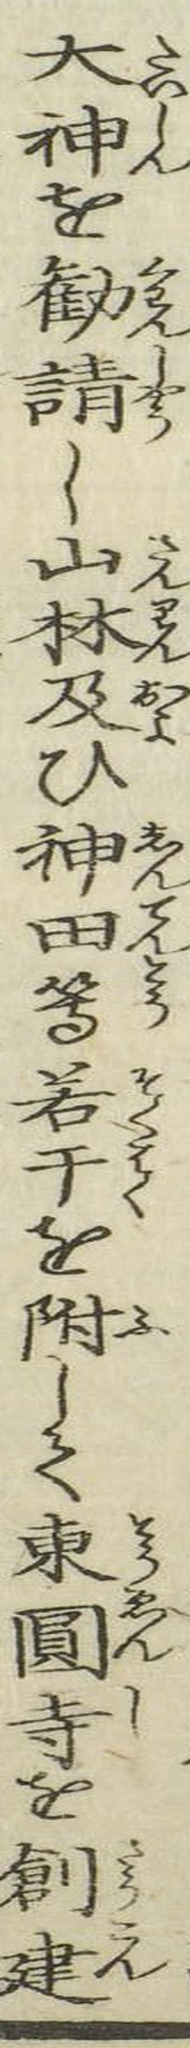大神を勧請し山林及ひ神田等若干を附して東円寺を創建
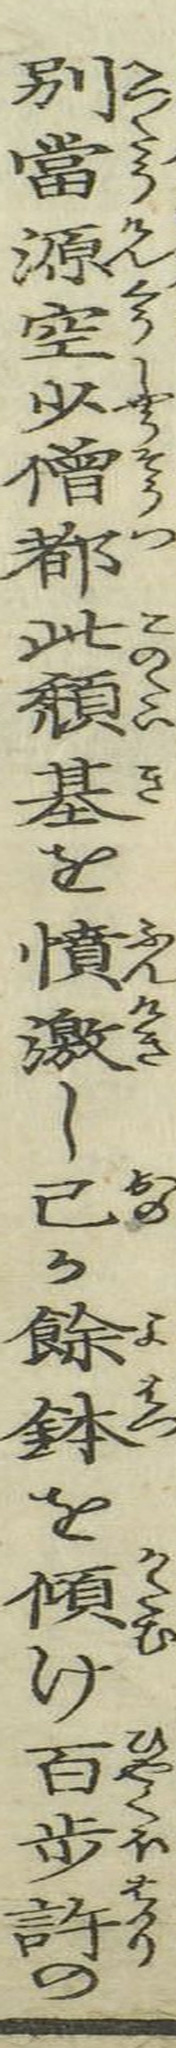別当源空少僧都此頽基を憤激し己か余鉢を傾け百歩許の
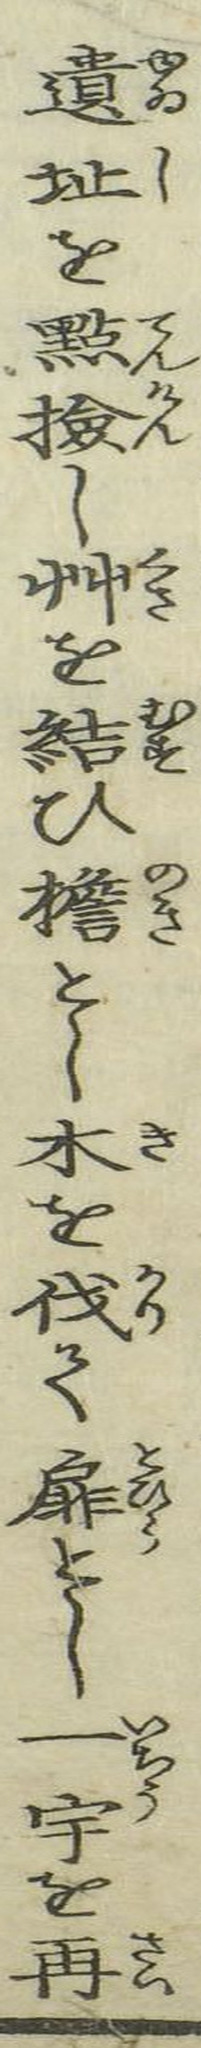遺址を点撿し艸を結ひ檐とし木を伐て扉とし一宇を再

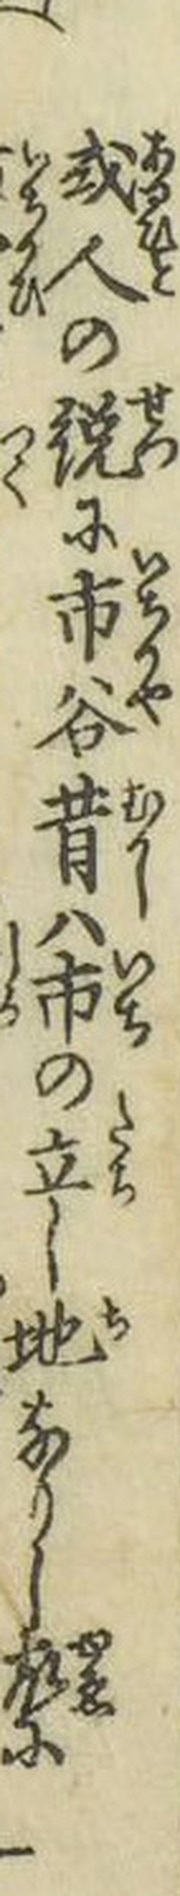或人の説に市谷昔は市の立し地なりし故に
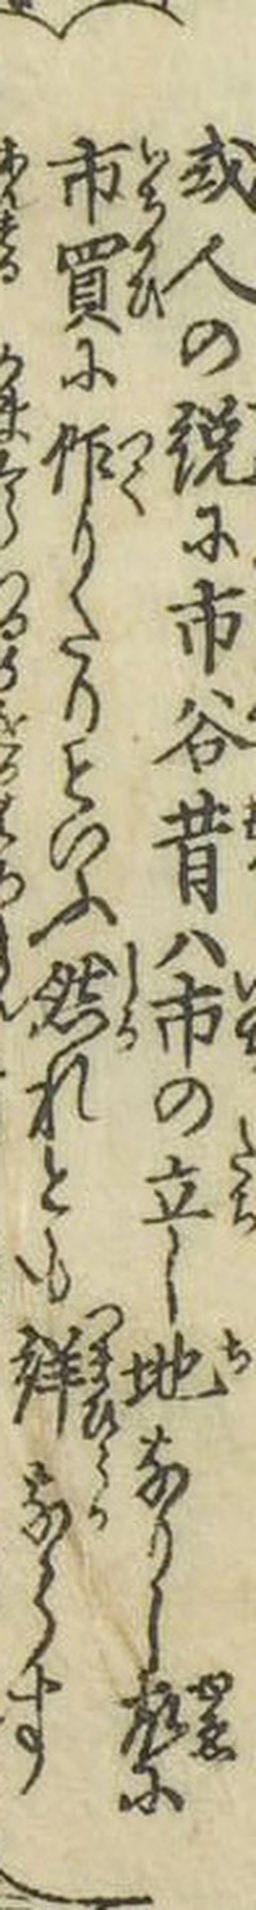市買に作りたりといふ然れとも詳ならす
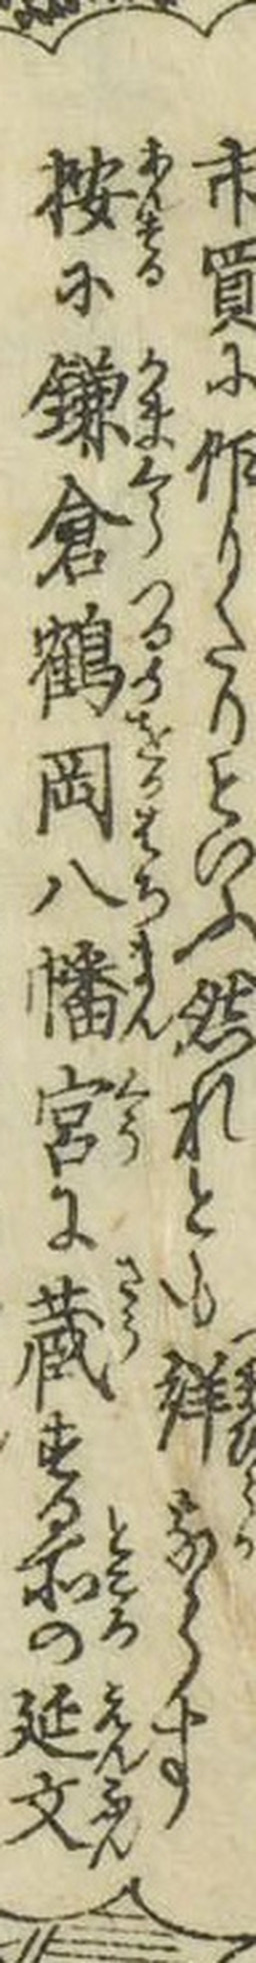按に鎌倉鶴岡八幡宮に蔵する所の延文
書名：江戸名所図会 20巻 巻之11
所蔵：東京学芸大学教育コンテンツアーカイブ
